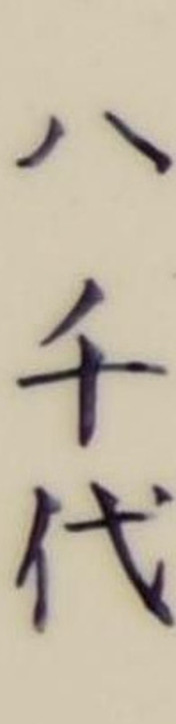八千代
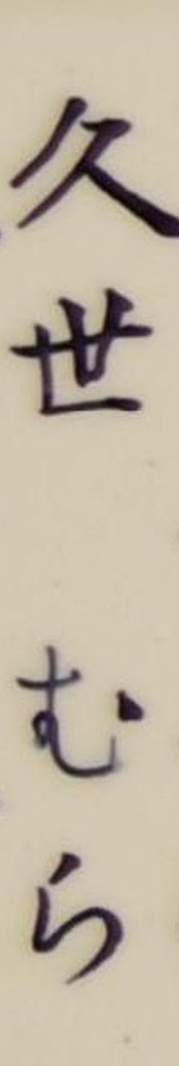久世むら
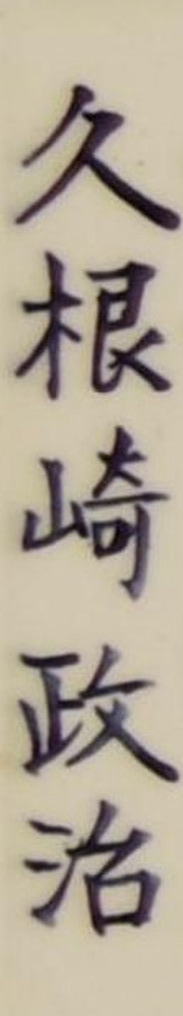久根崎政治

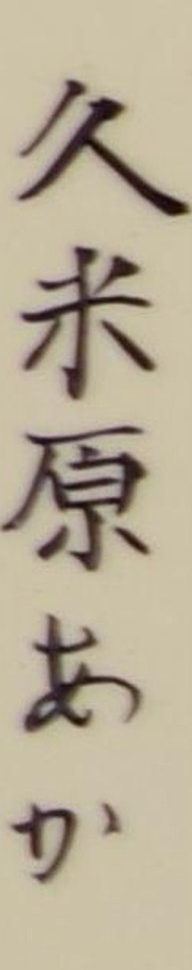久米原あか
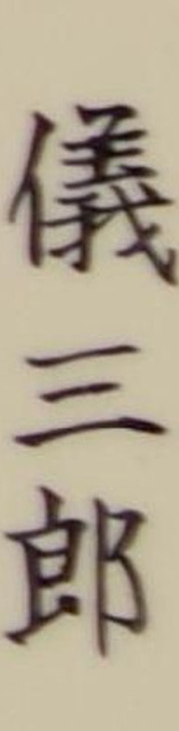儀三郎
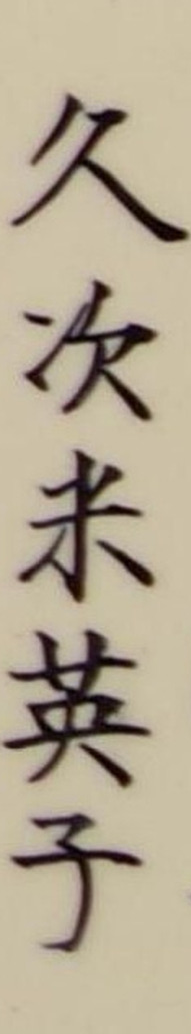久次米英子
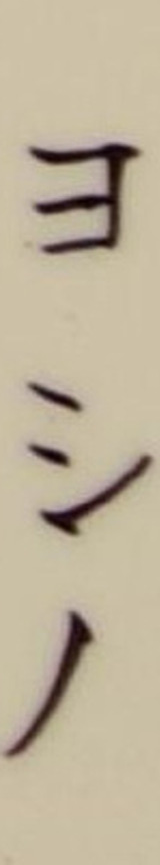ヨシノ
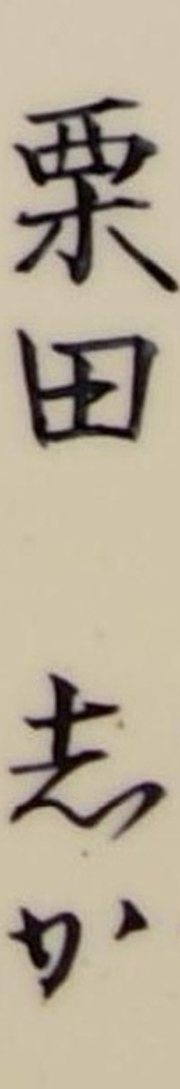栗田しか
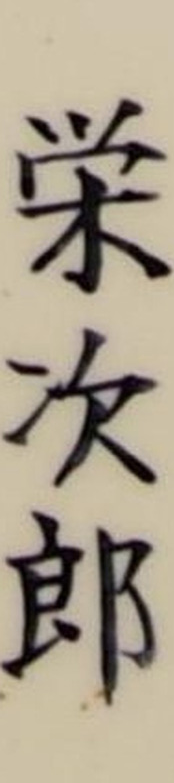栄次郎
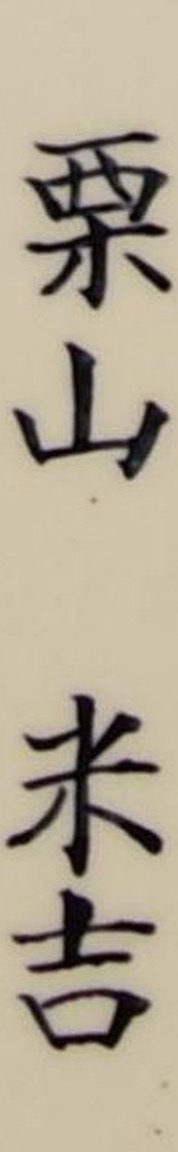栗山米吉
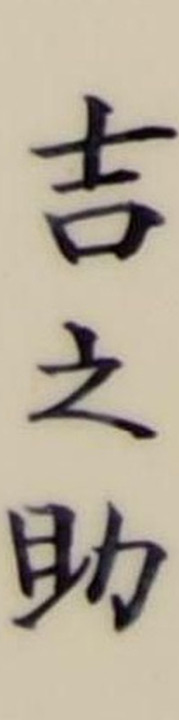吉之助
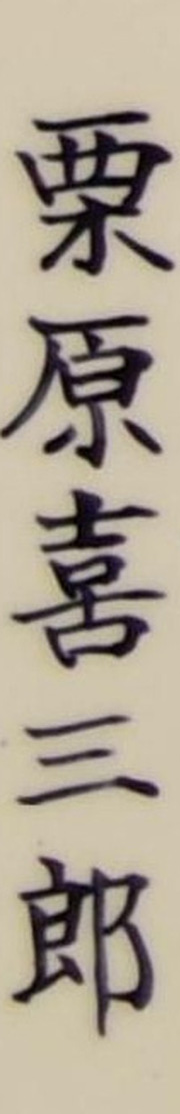栗原喜三郎

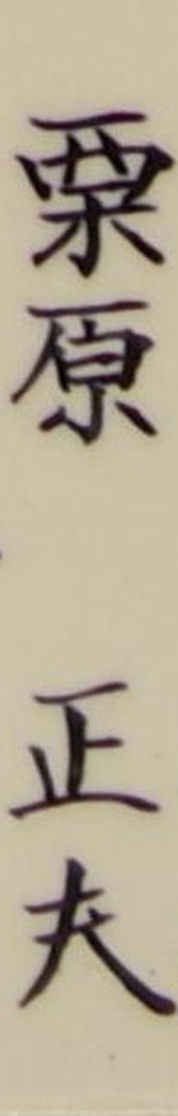栗原正夫
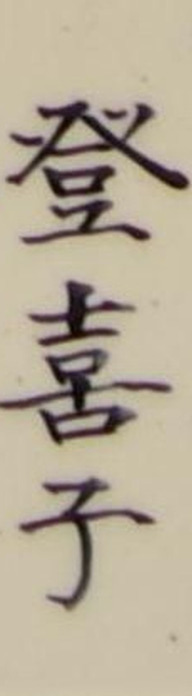登喜子
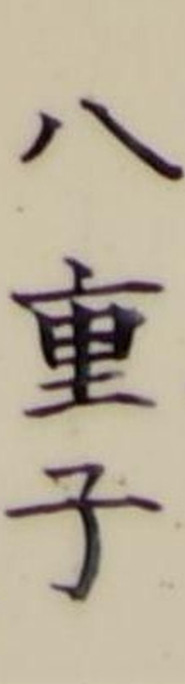八重子
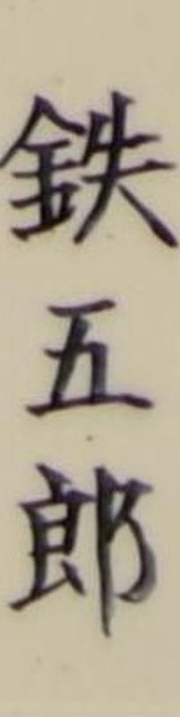鉄五郎
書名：A~D
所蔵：koyasan kongobuji
